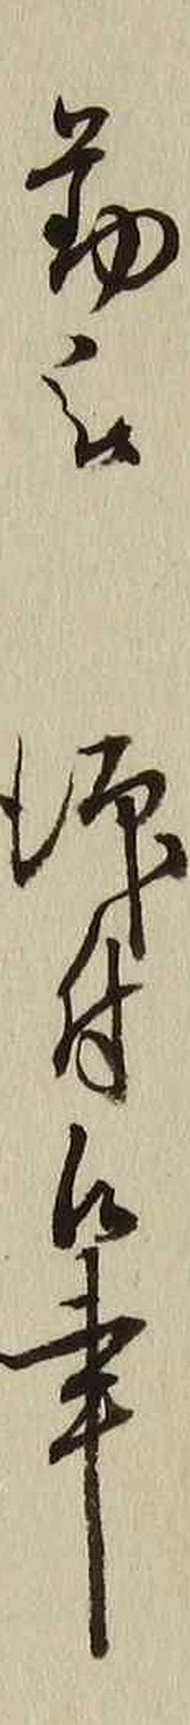勤被仰付候事
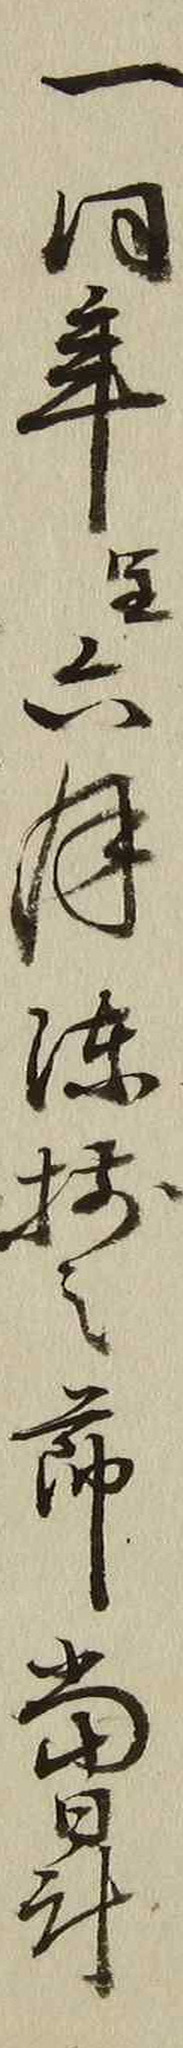一同年閏六月陣揃之節当日計
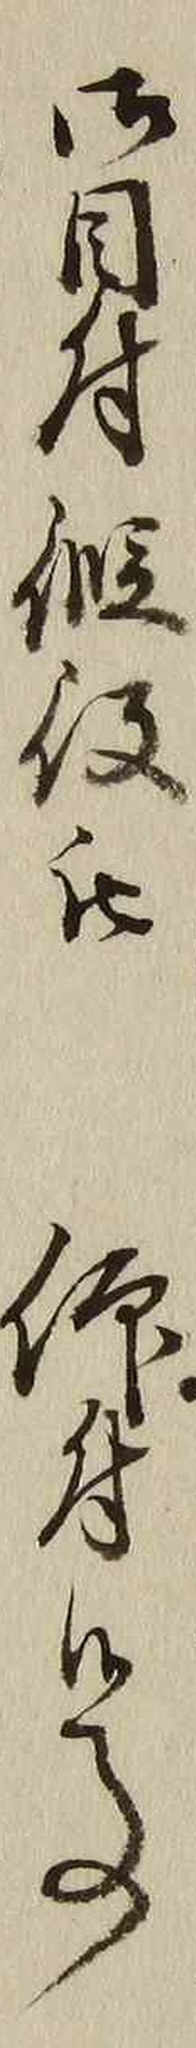御目付仮役被仰付候事
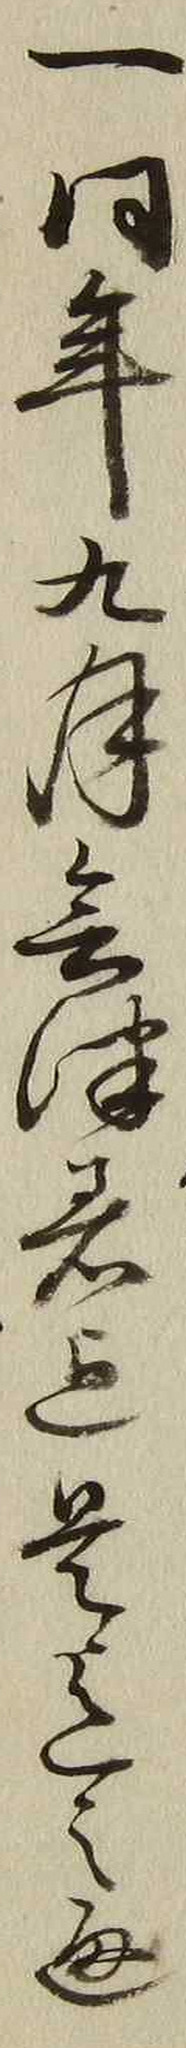一同年九月会津着迄是迄之通
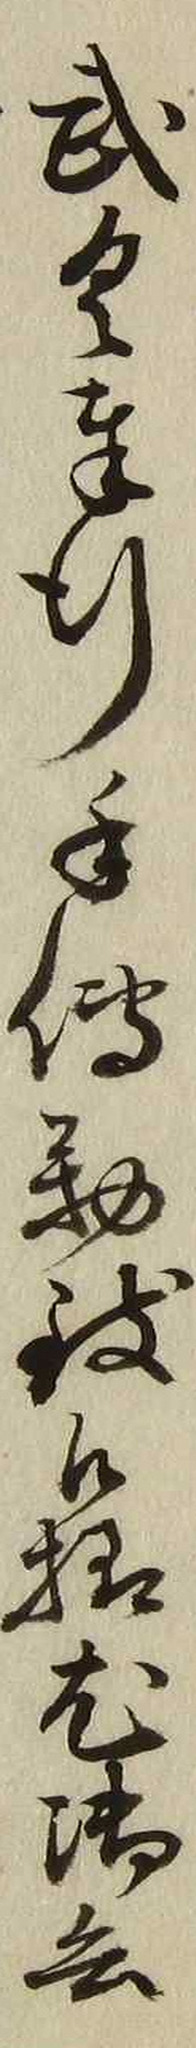武具奉行手伝勤致候様尤御兵
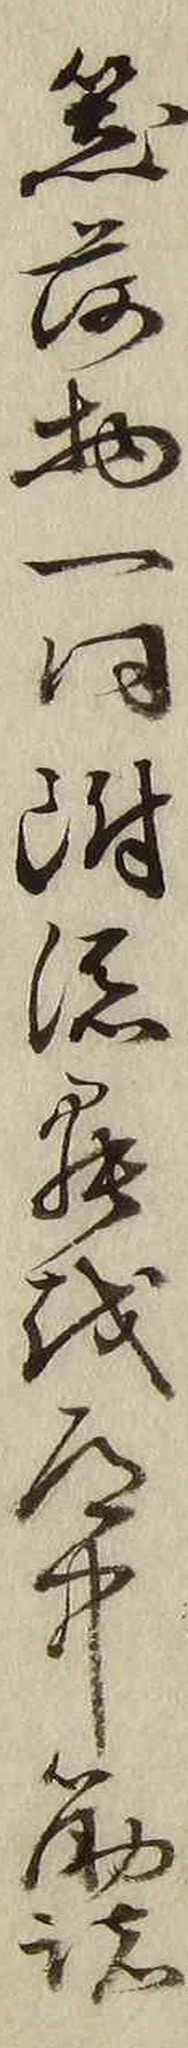器荷物一同附添罷越道中筋諸
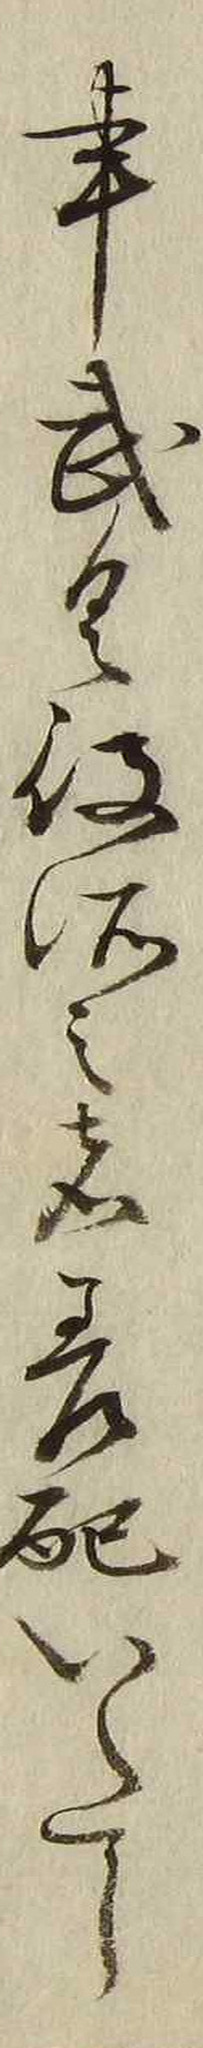事武具役所之者差配いたし
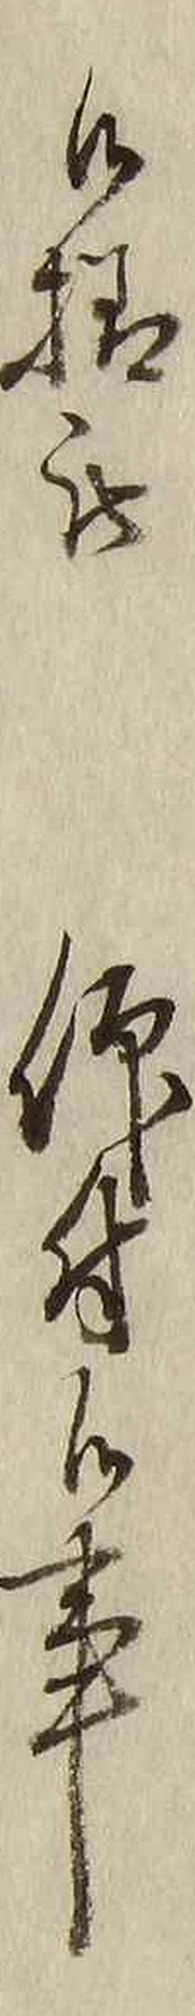候様被仰付候事
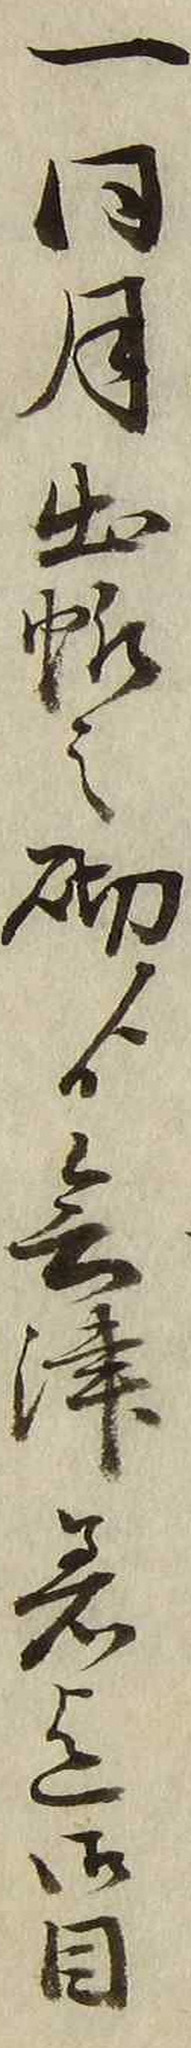一同月出㠶之砌ゟ会津着迄御目
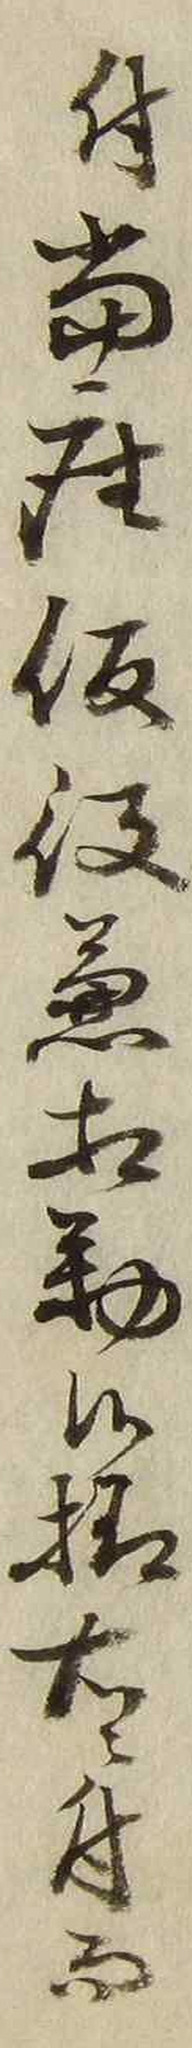付当座仮役兼相勤候様右ニ付而

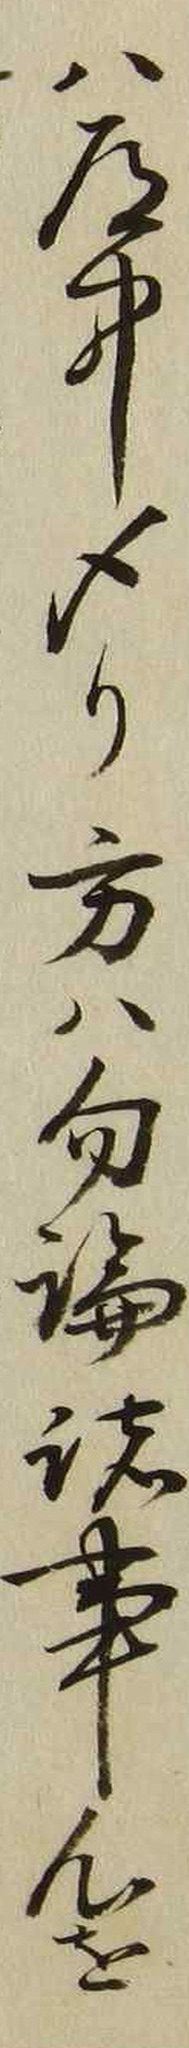ハ道中〆り方ハ勿論諸事心を
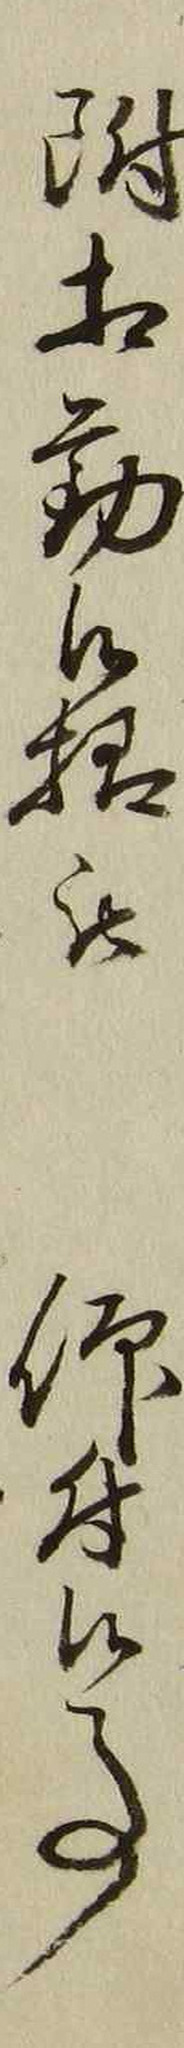附相勤候様被仰付候事
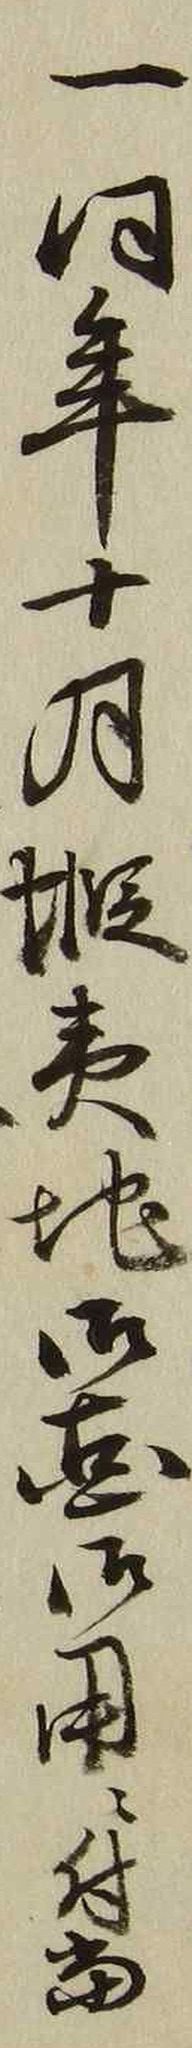一同年十月蝦夷地御固御用ニ付当
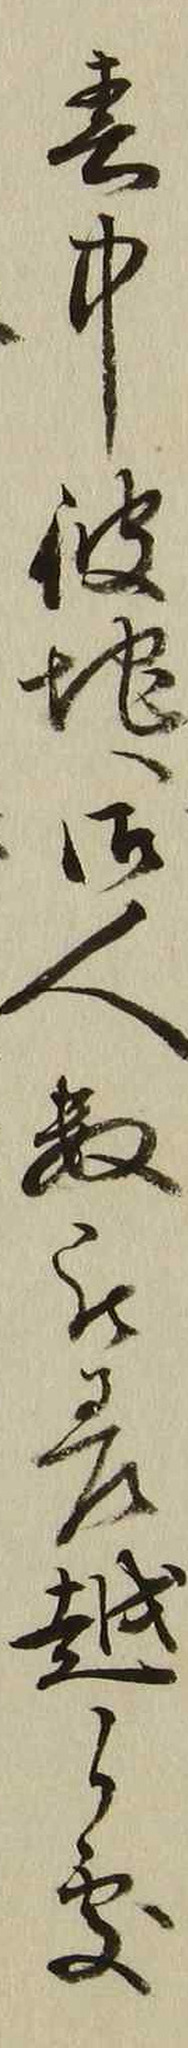春中彼地へ御人数被差越候処
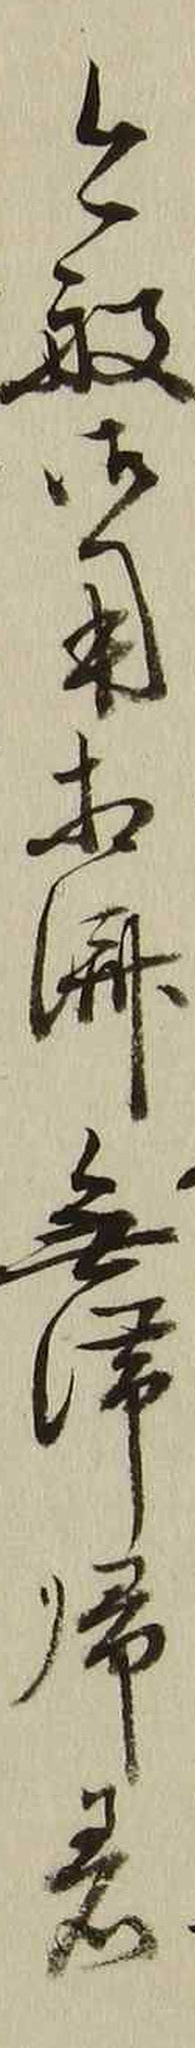今般御用相済無滞帰着
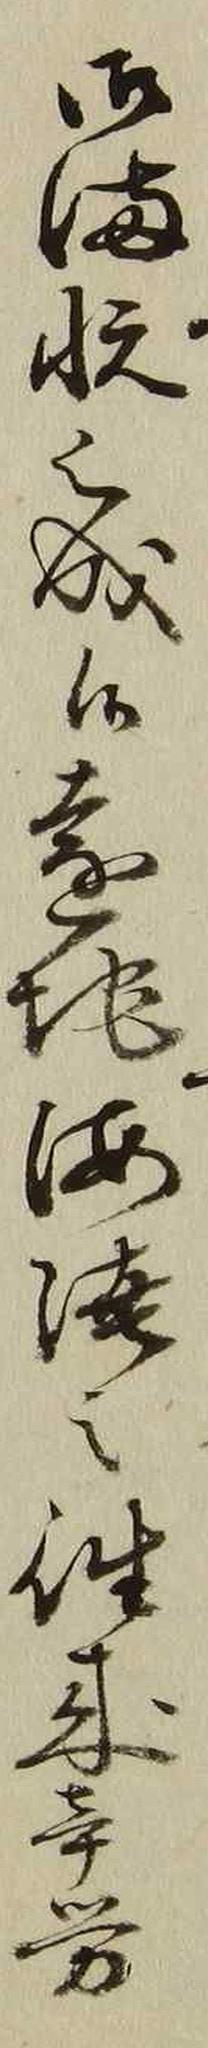御満悦被成候遠地海陸之往来辛労
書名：諸士系譜　巻之35　は之部3
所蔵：会津若松市立会津図書館
